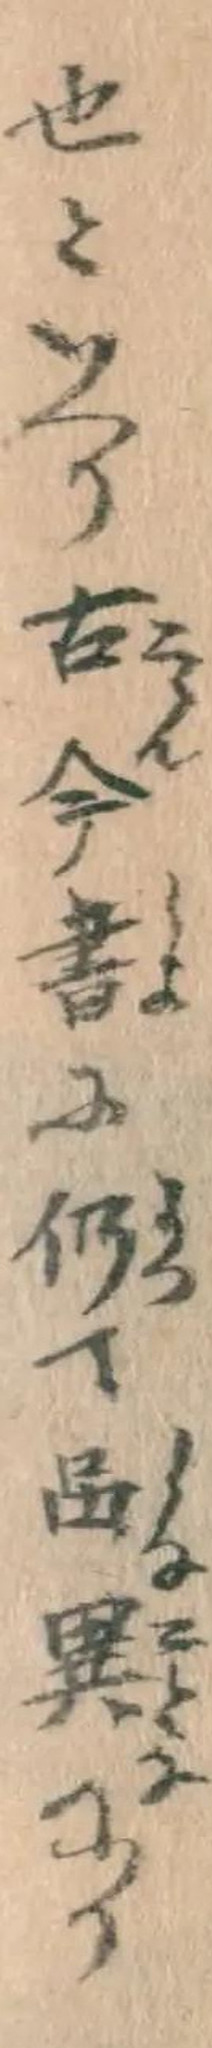也といへり古今書に仍て品異なり
